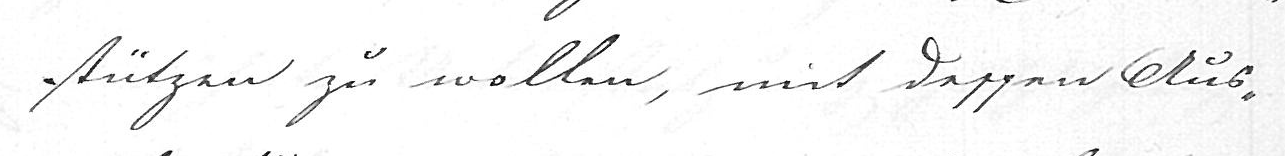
stützen zu wollen, mit dessen Aus-
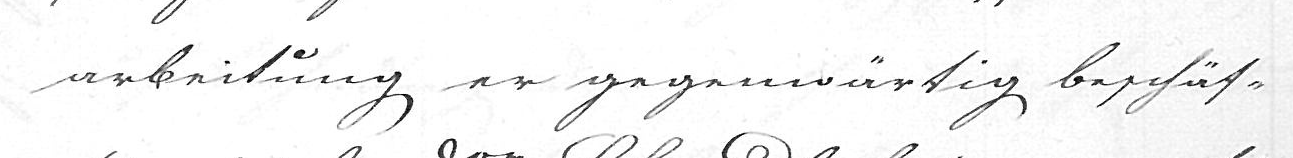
arbeitung er gegenwärtig beschäf-
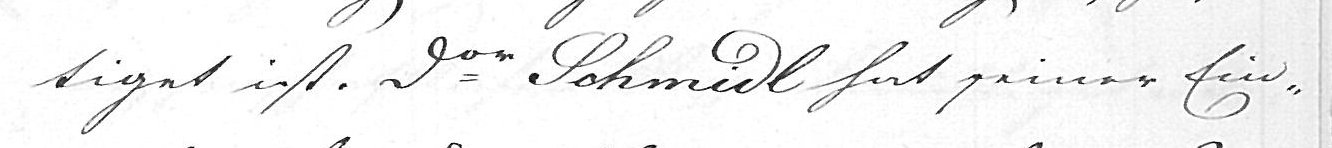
tiget ist. Dor Schmidl hat seiner Ein-
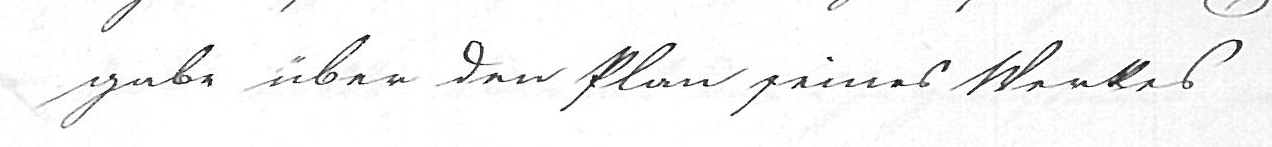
gabe über den Plan seines Werkes
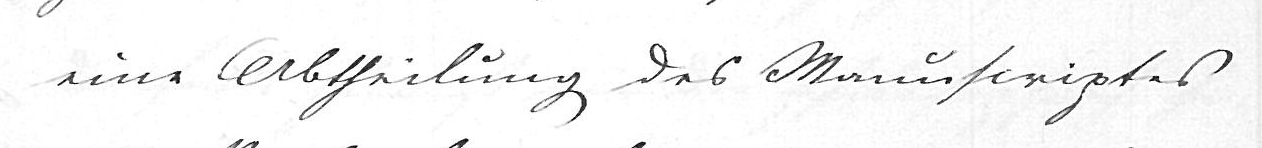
eine Abtheilung des Manuscriptes
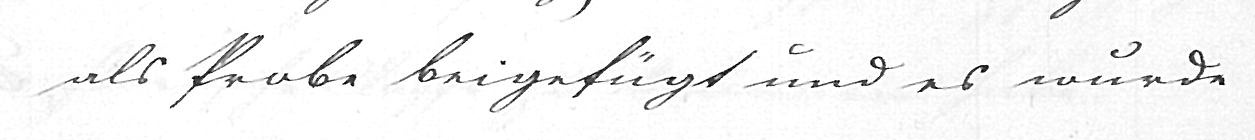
als Probe beigefügt und es wurde
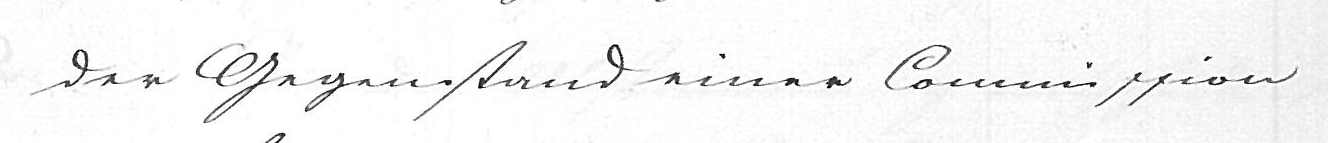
der Gegenstand einer Commission
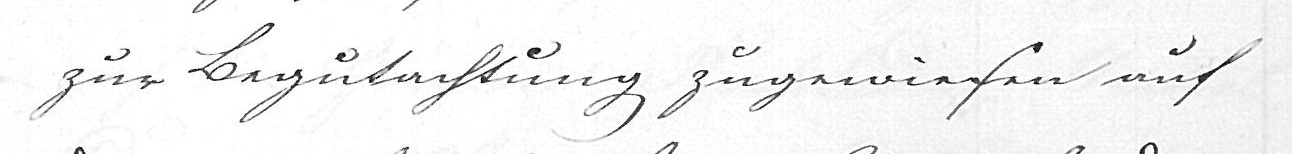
zur Begutachtung zugewiesen auf
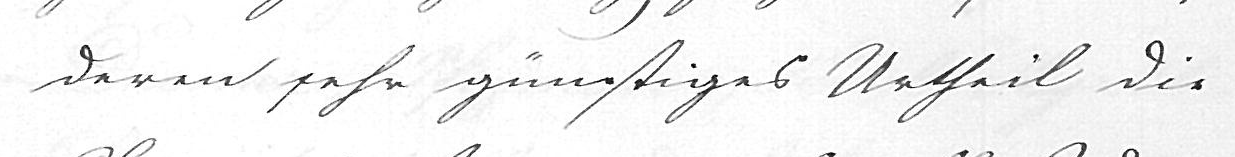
deren sehr günstiges Urtheil die
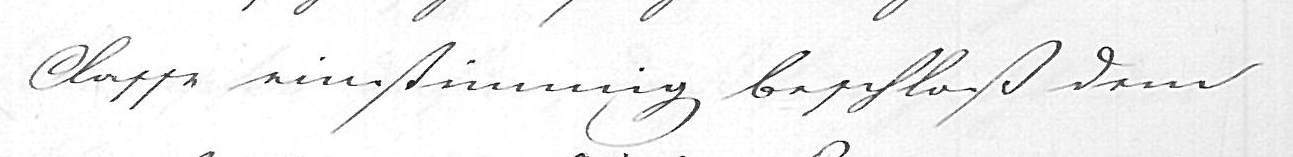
Classe einstimmig beschloß dem
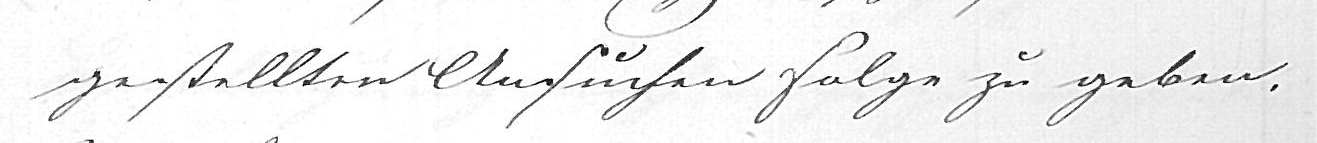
gestellte Ansuchen Folge zu geben.
